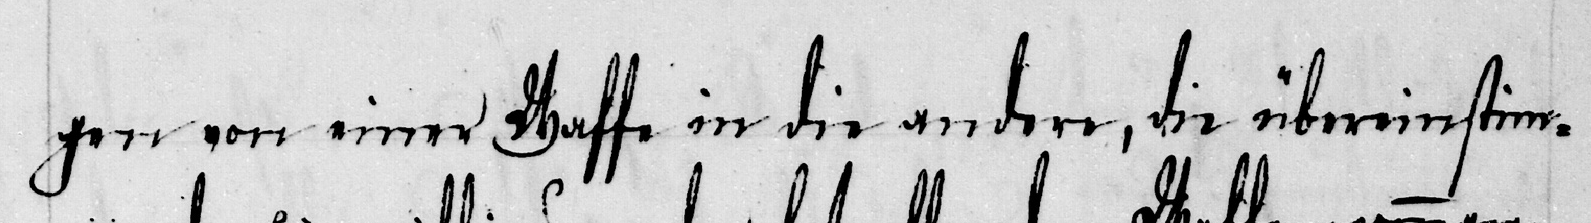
gen von einer Waffe in die andere, die übereinstim¬
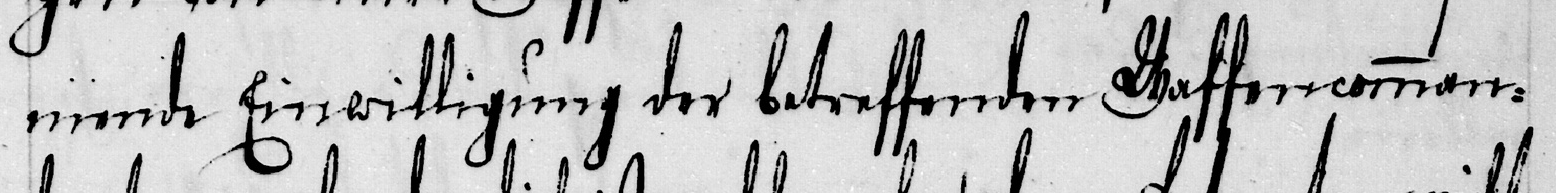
mende Einwilligung der betreffenden Waffencomman¬
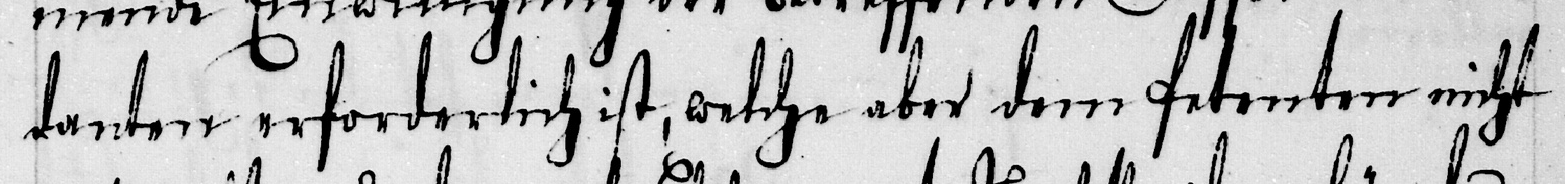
danten erforderlich ist, welche aber dem Petenten nicht
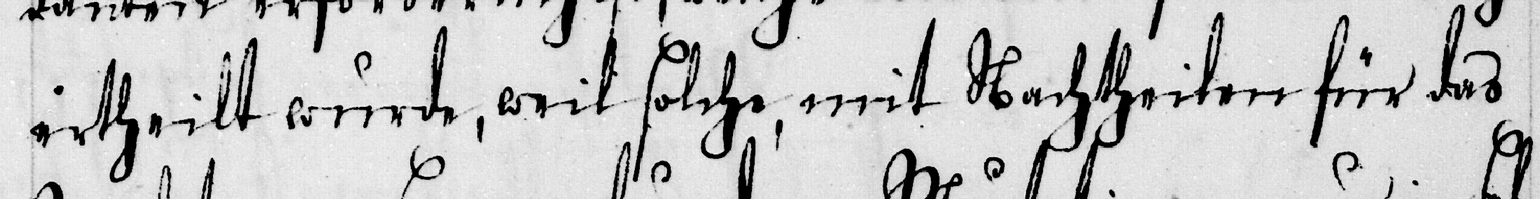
ertheilt wurde, weil solche, mit Nachtheilen für das
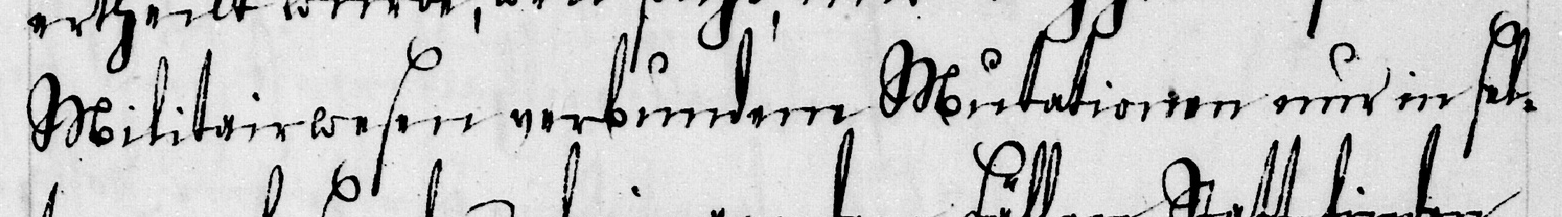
Militairwesen verbundene Mutationen nur in sel¬
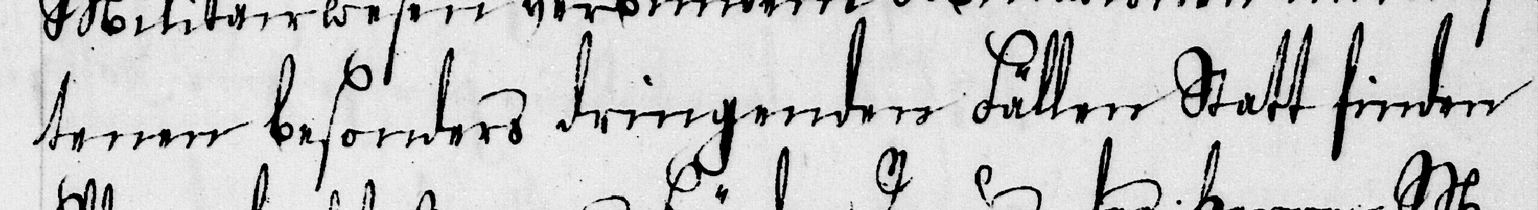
tenen besonders dringenden Fällen Statt finden
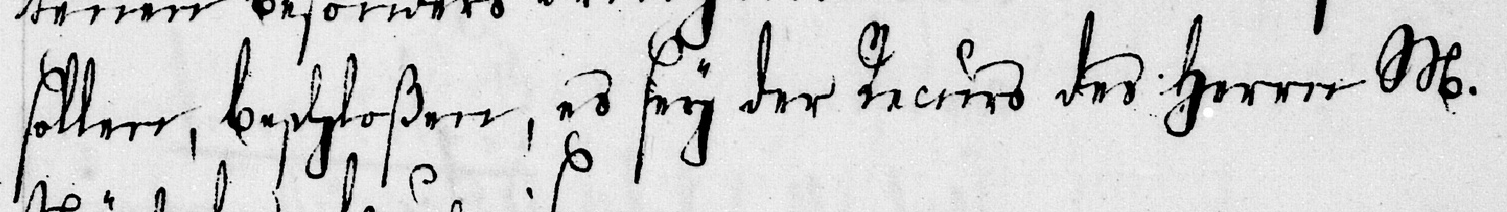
sollen, beschloßen, es sey der Recurs des Herrn M.
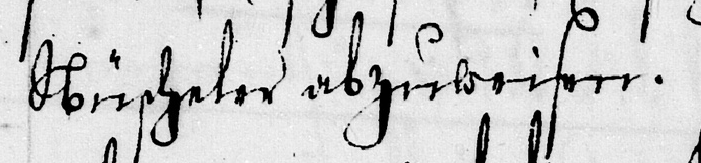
Nüscheler abzuweisen.
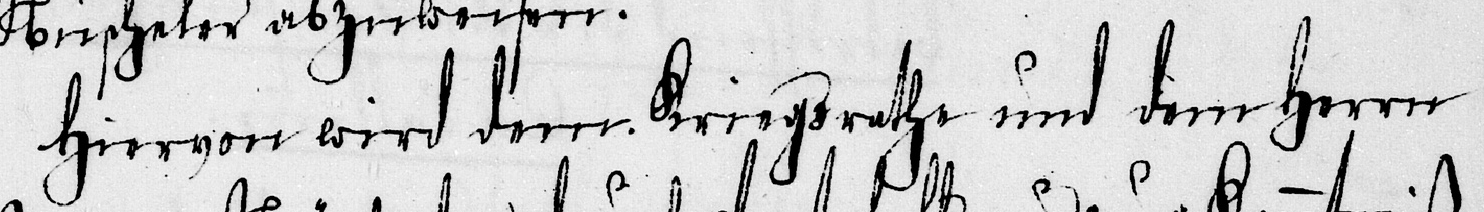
Hiervon wird dem Kriegsrathe und dem Herrn
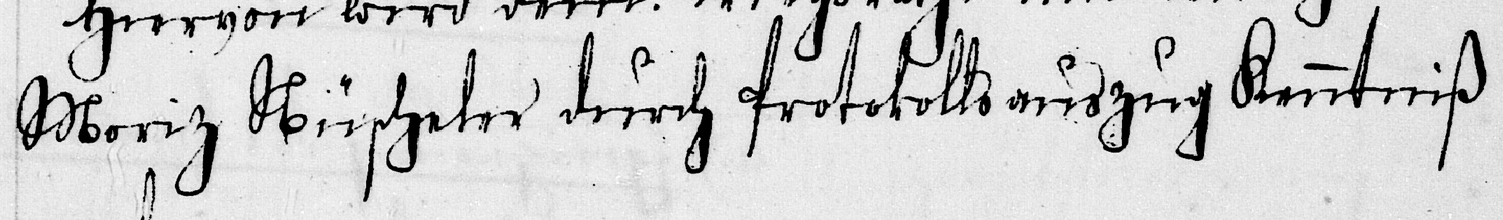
Moriz Nüscheler durch Protokollsauszug Kenntniß
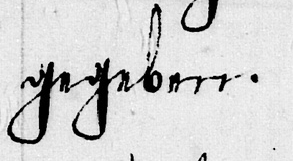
gegeben.
